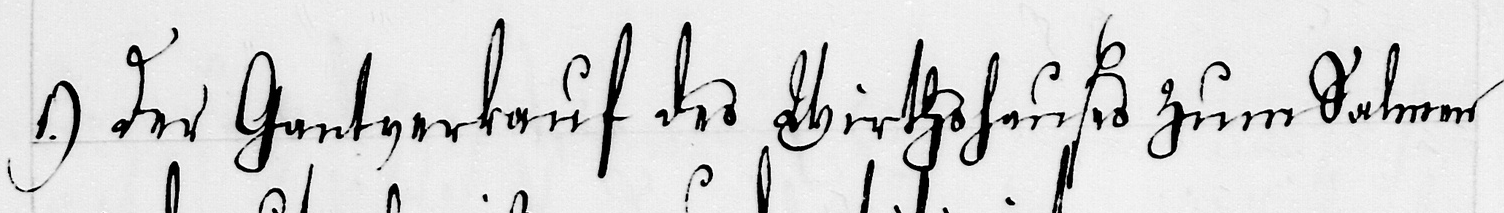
1.) Der Gantverkauf des Wirthshauses zum Salmen
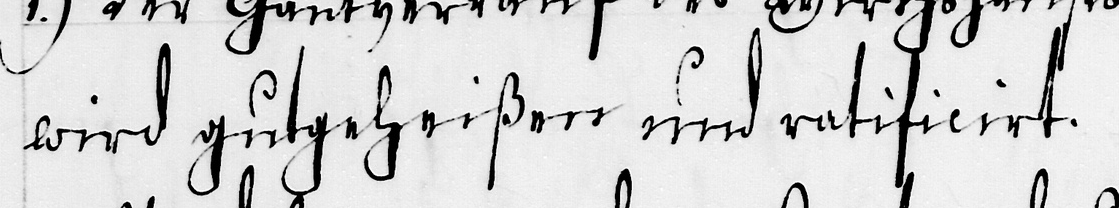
wird gutgeheißen und ratificirt.
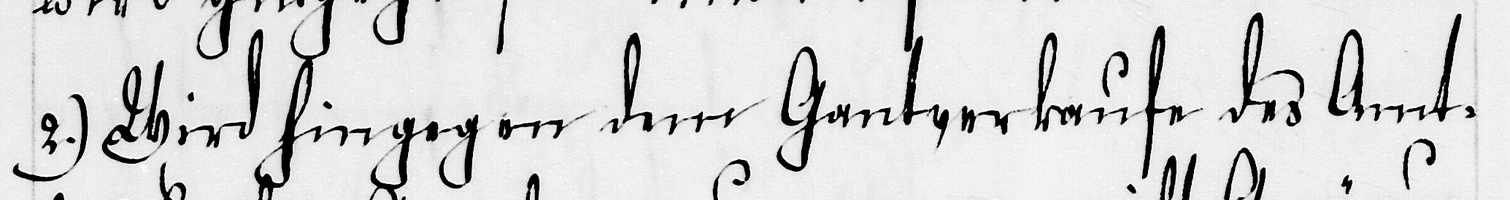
2.) Wird hingegen dem Gantverkaufe des Amt¬
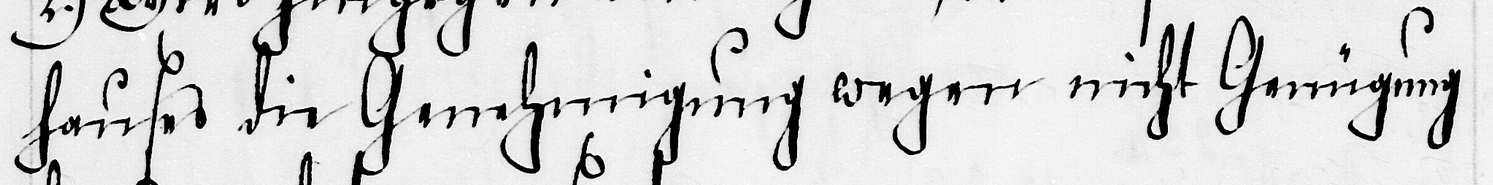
hauses die Genehmigung wegen nicht Genügung
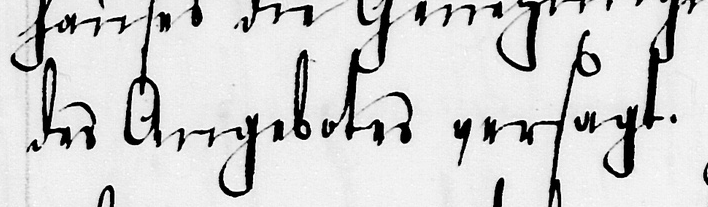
des Angebotes versagt.
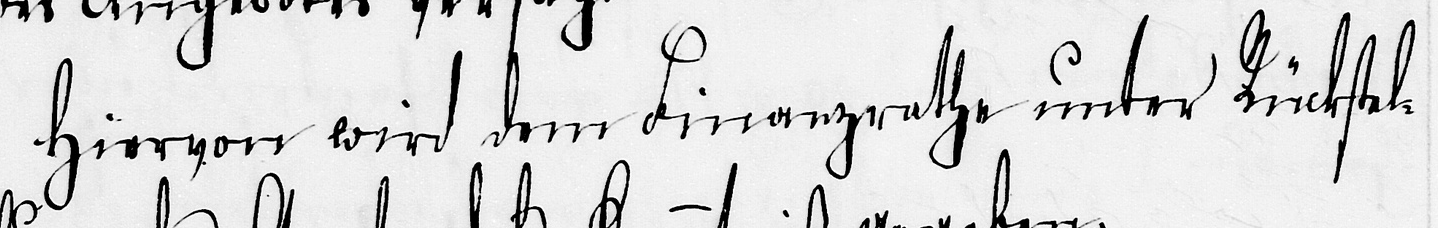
Hiervon wird dem Finanzrathe unter Rückste¬
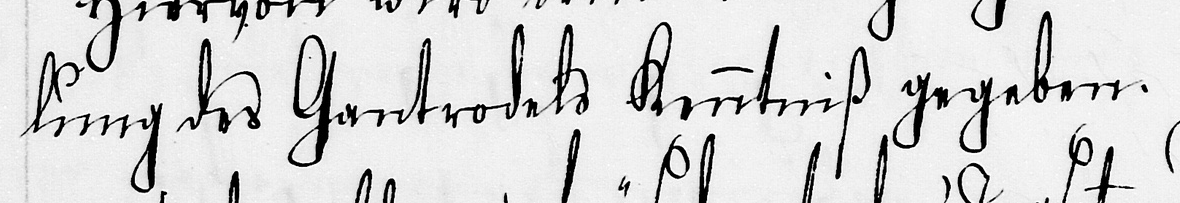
lung des Gantrodels Kenntniß gegeben.
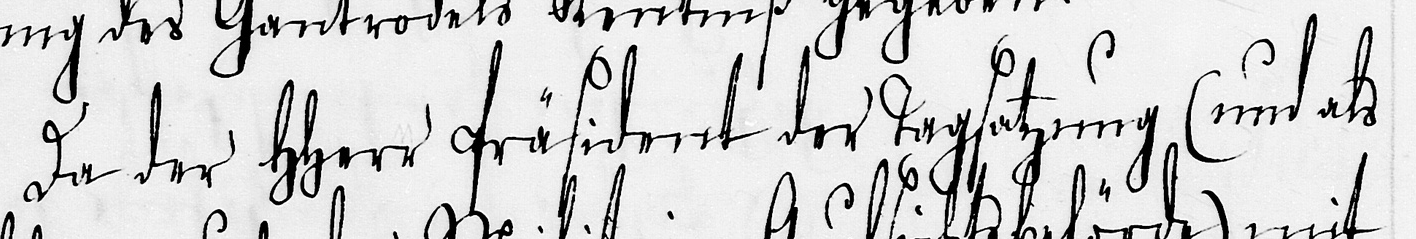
Da der HHerr Präsident der Tagsatzung (und als
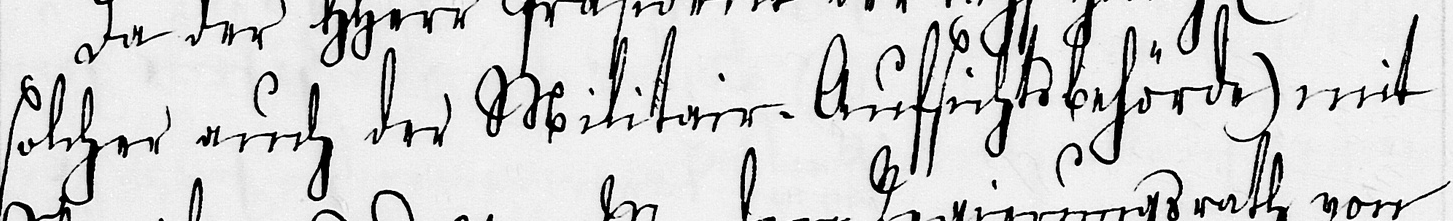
olcher auch der Militair-Aufsichtsbehörde) mit
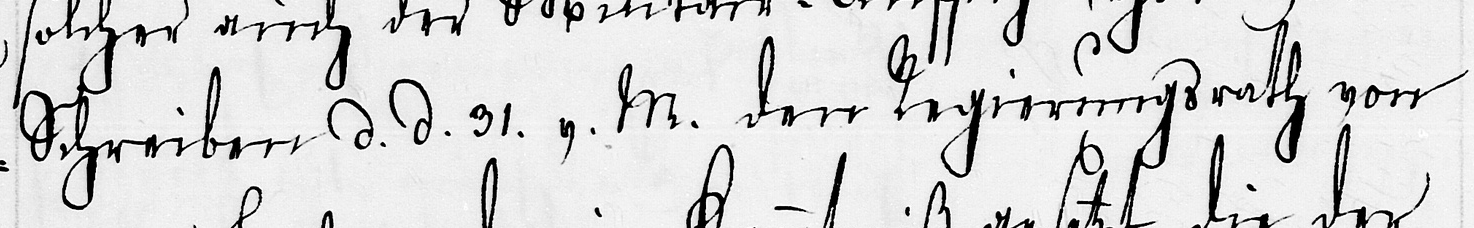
Schreiben d. d. 31. v. M. den Regierungsrath von
